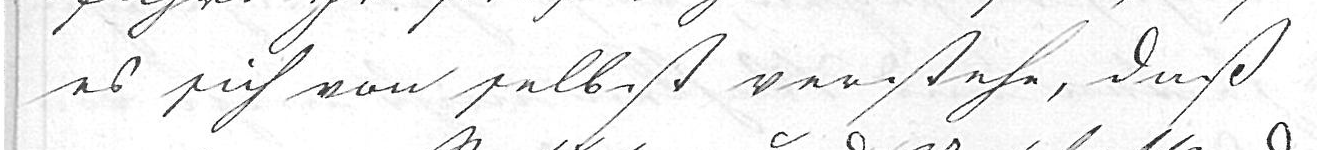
es sich von selbst verstehe, daß
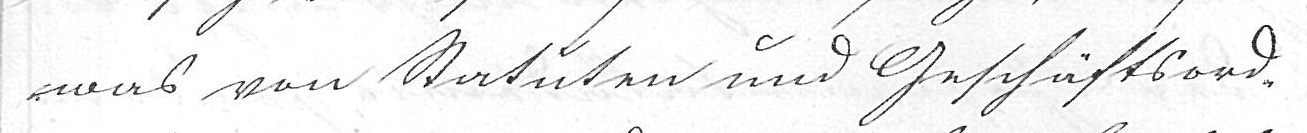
was von Statuten und Geschäftsord-
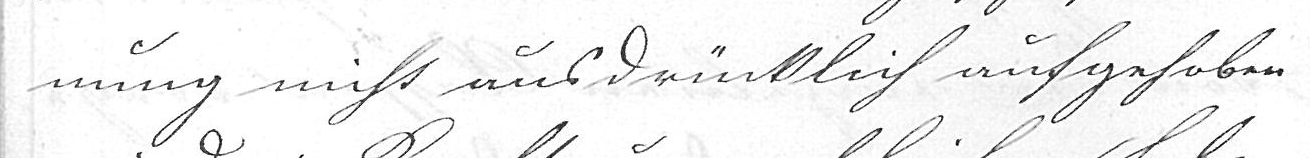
nung nicht ausdrücklich aufgehoben
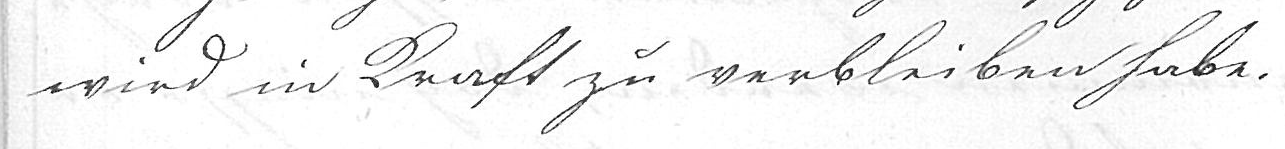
wird in Kraft zu verbleiben habe.
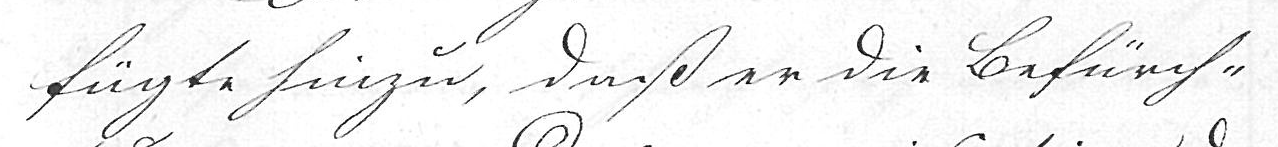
fügte hinzu, daß er die Befürch-
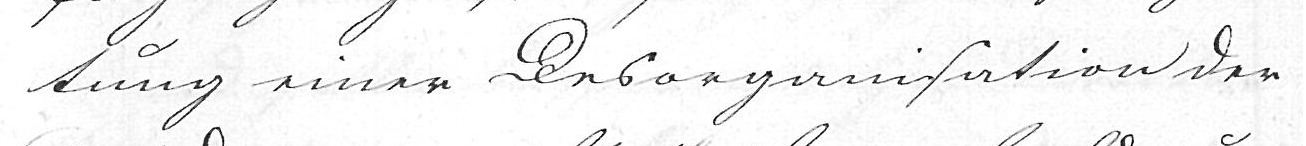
tung einer Desorganisation der
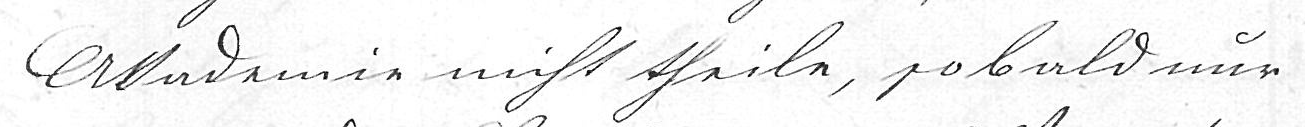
Akademie nicht theile, sobald nur
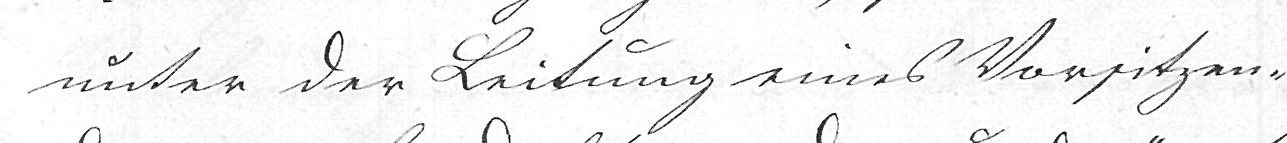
unter der Leitung eines Vorsitzen-
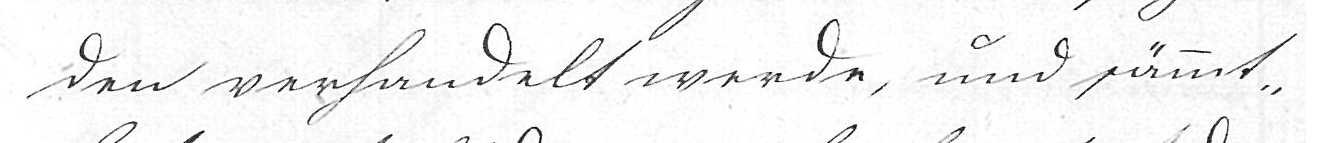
den verhandelt werde, und sämmt-
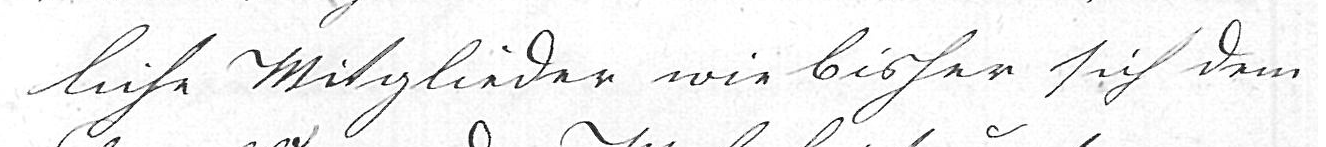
liche Mitglieder wie bisher sich dem
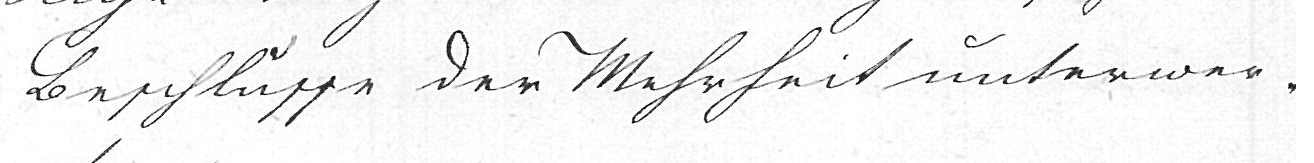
Beschlusse der Mehrheit unterwer-
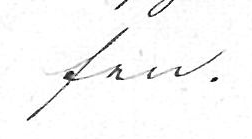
fen.
